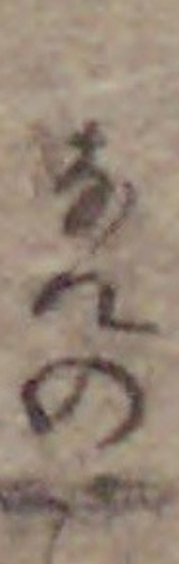なんの
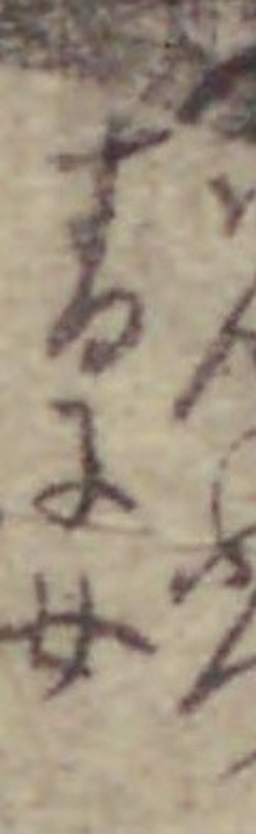するに女
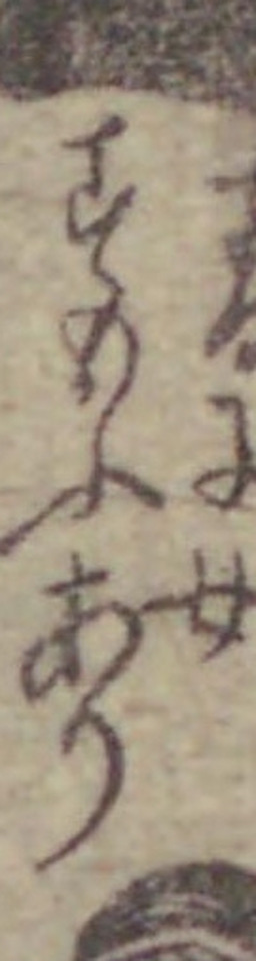すもふあり
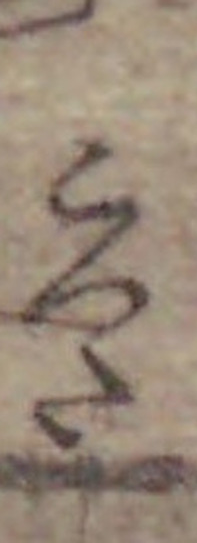こつた
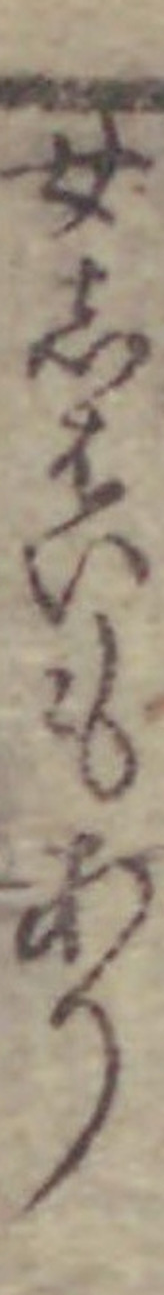女しはいもあり
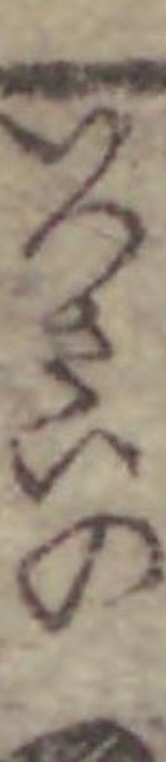いつさいの
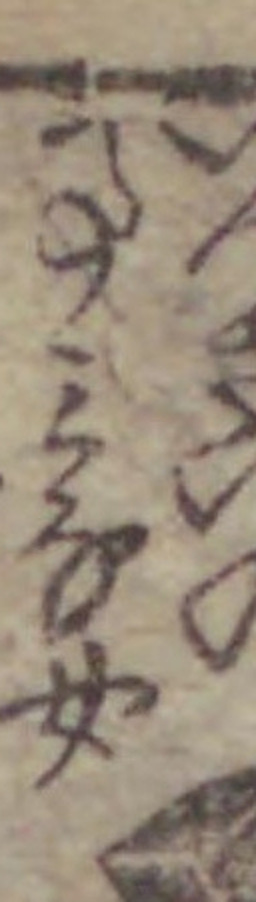事みな女
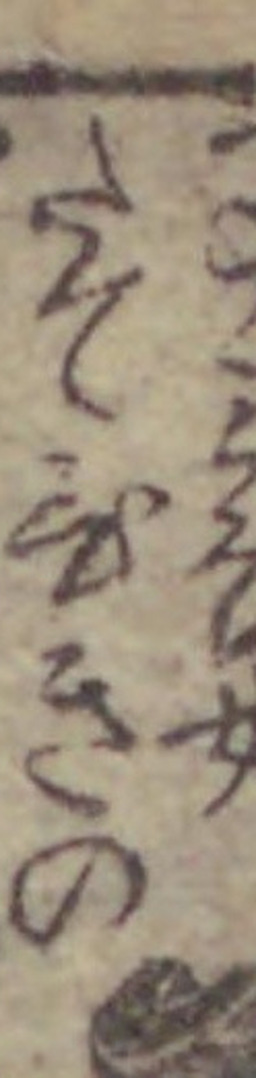たてひきの
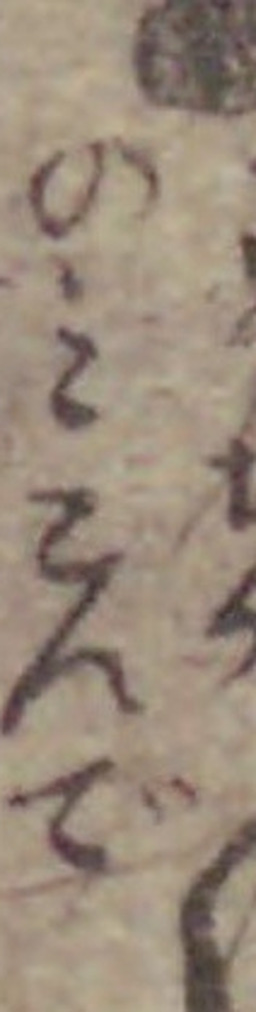のみこんで
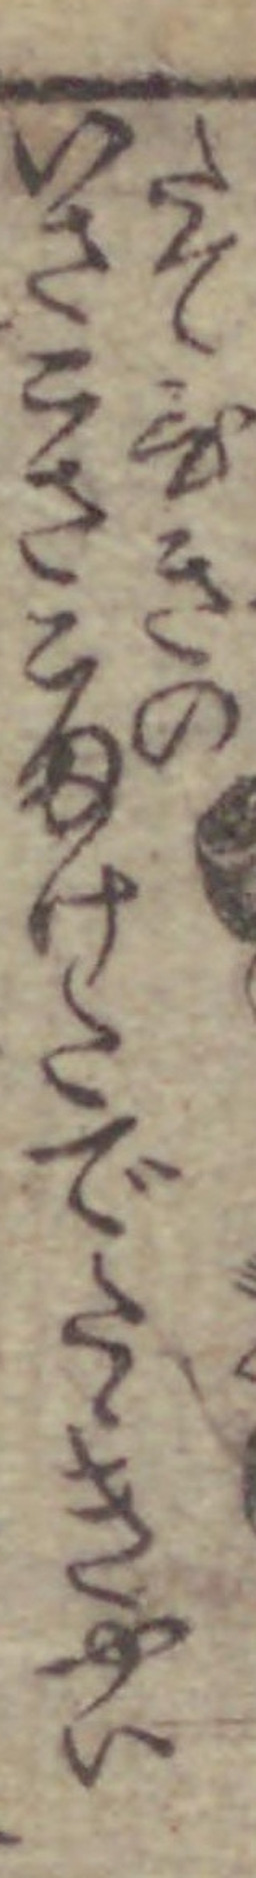いさこさこまけたでたゝきやい
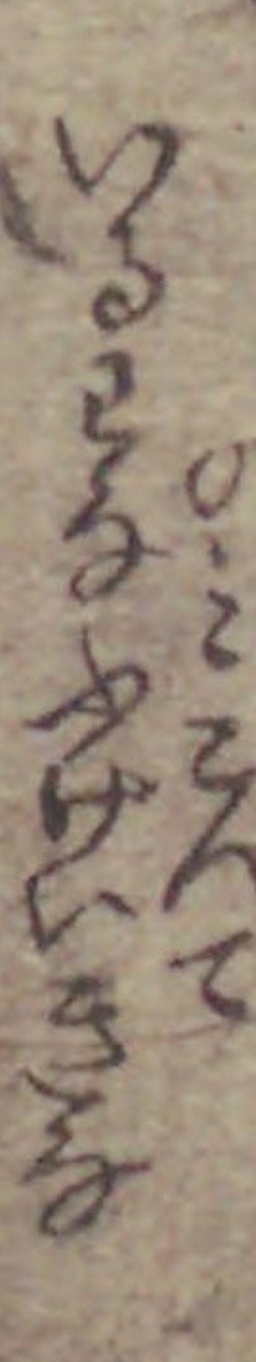いるわなふけいきな
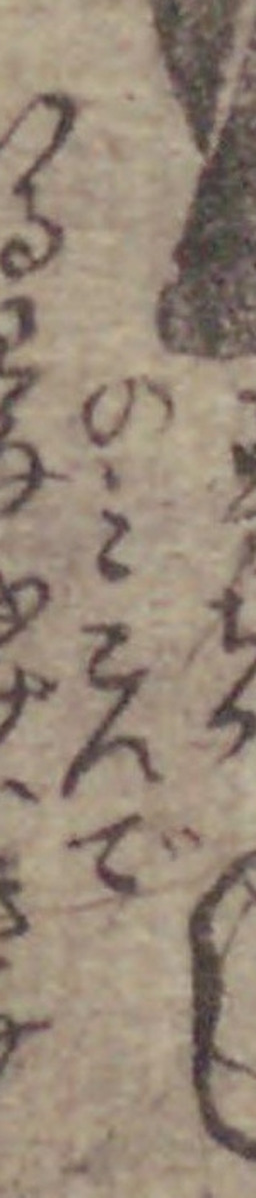いるわなふけいきな
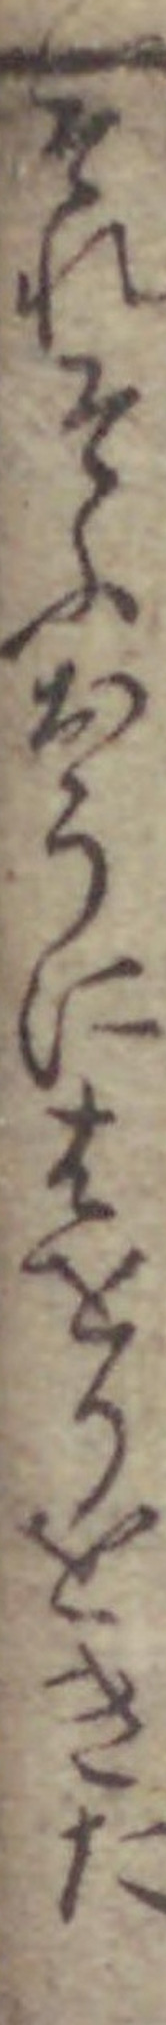それそふおうにはをりをきた
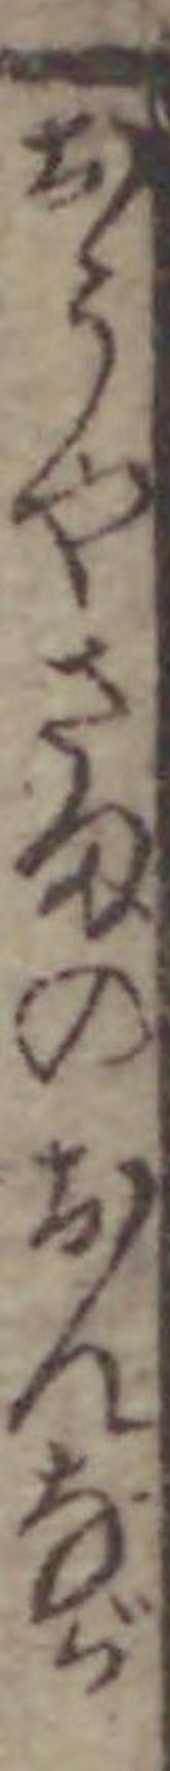おうやさまのおんなが
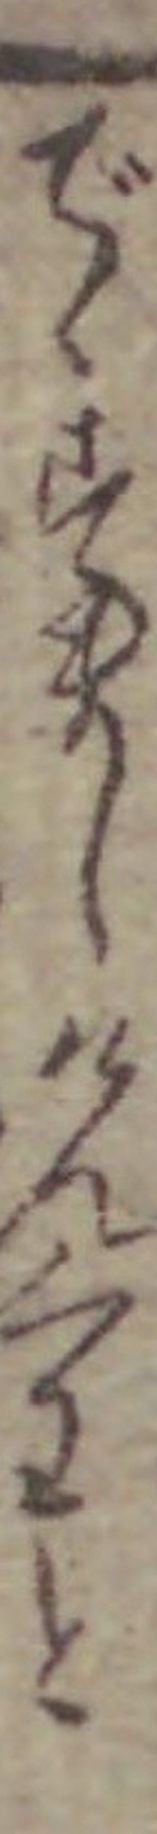でゝすましけんくわと
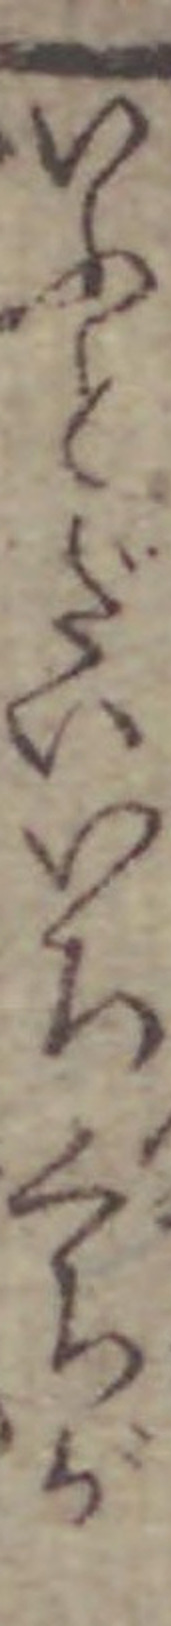いふとだいいちくちが
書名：近頃嶋めぐり 3巻
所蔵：国立国会図書館 National Diet Library, JAPAN
